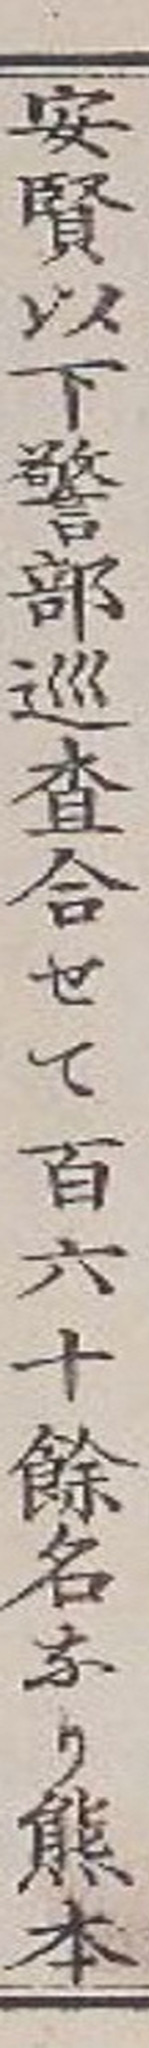安賢以下警部巡査合せて百六十余名なり熊本

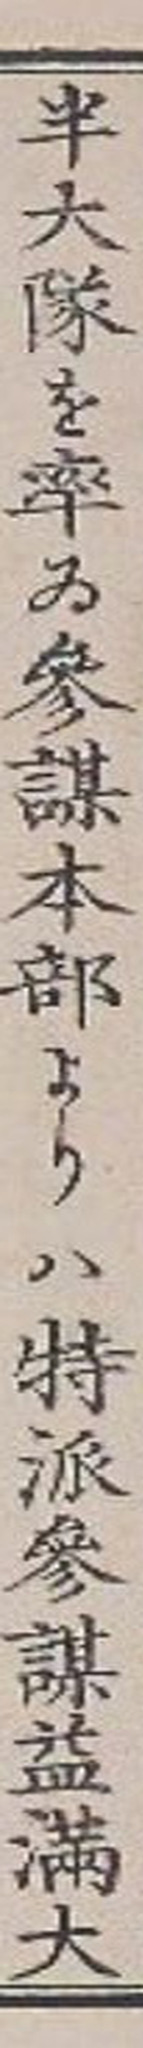半大隊を率ゐ参謀本部よりは特派参謀益満大
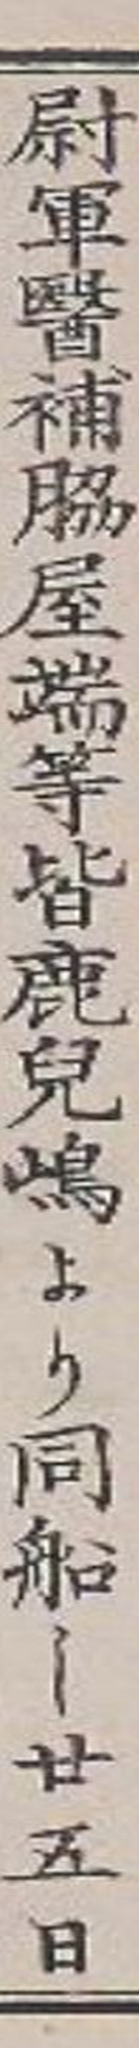尉軍医補脇屋端等皆鹿児島より同船し廿五日
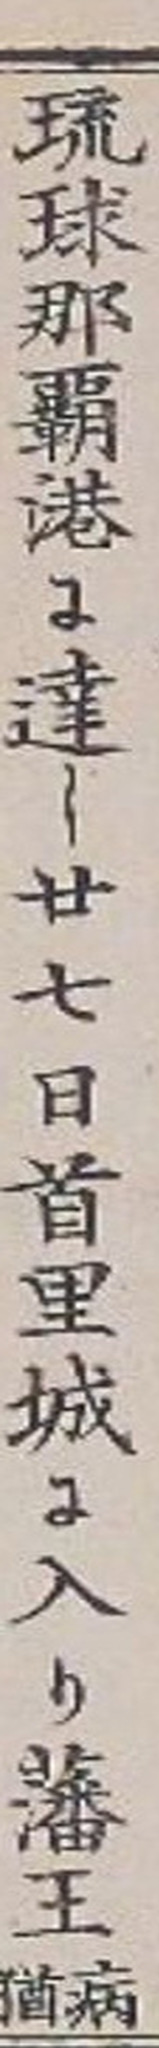琉球那覇港に達し廿七日首里城に入り藩王病猶
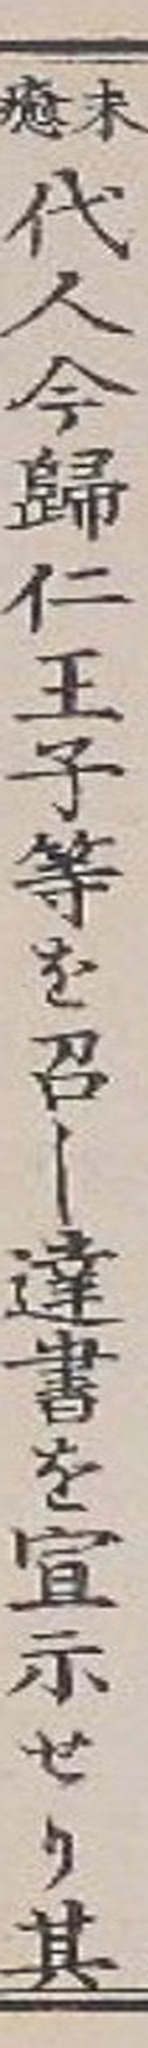未癒代人今帰仁王子等を召し達書を宣示せり其
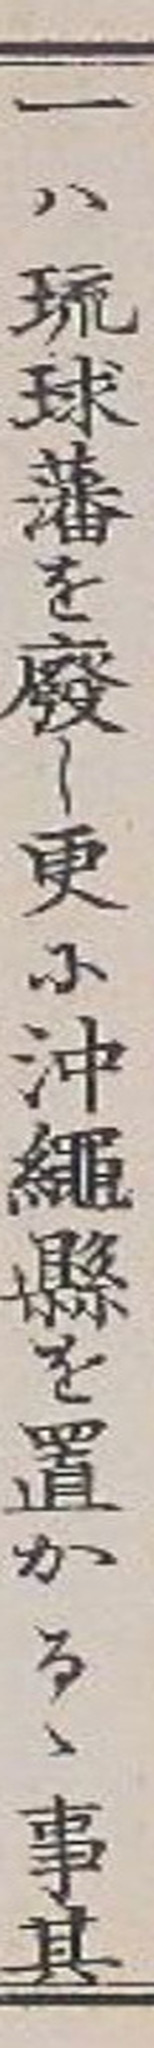一は琉球藩を廃し更に沖縄県を置かるゝ事其
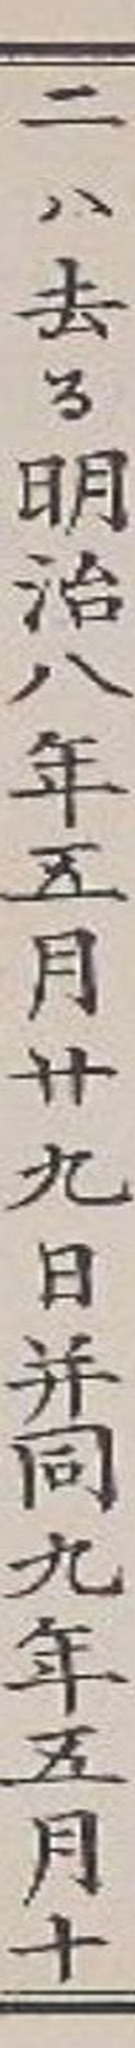ニは去る明治八年五月廿九日並同九年五月十
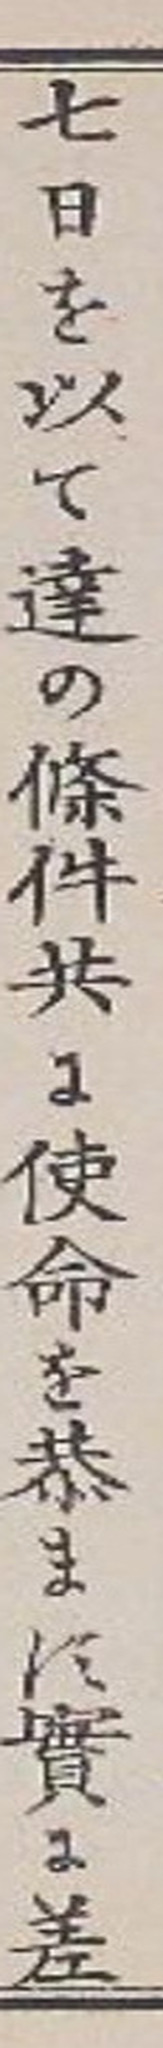七日を以て達の条件共に使命を恭ます実に差
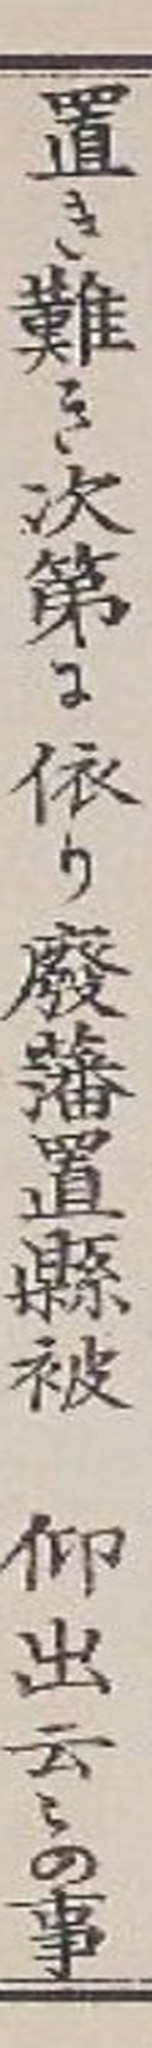置き難き次第に依り廃藩置県被仰出云々の事
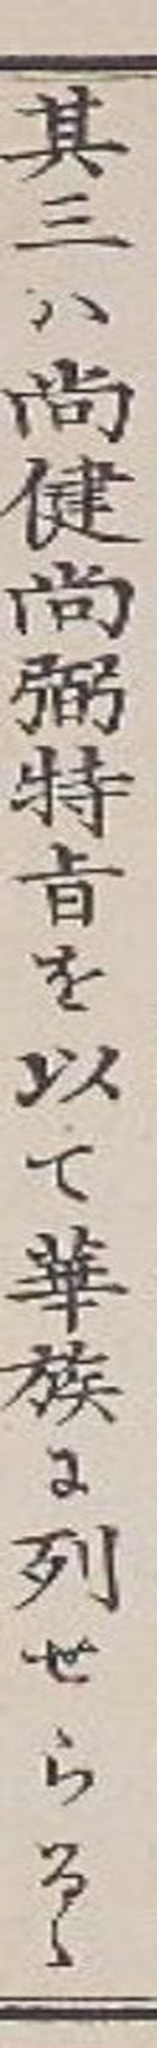其三は尚健尚弼特旨を以て華族に列せらるゝ
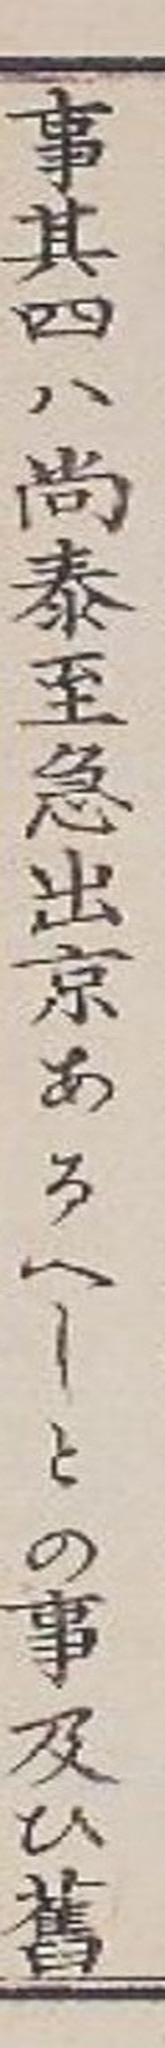事其四は尚泰至急出京あるへしとの事及ひ旧
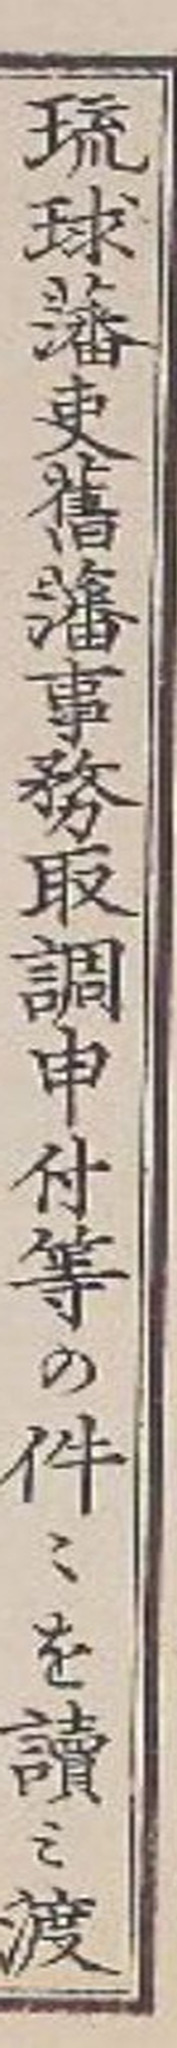琉球藩吏旧藩事務取調申付等の件々を読み渡
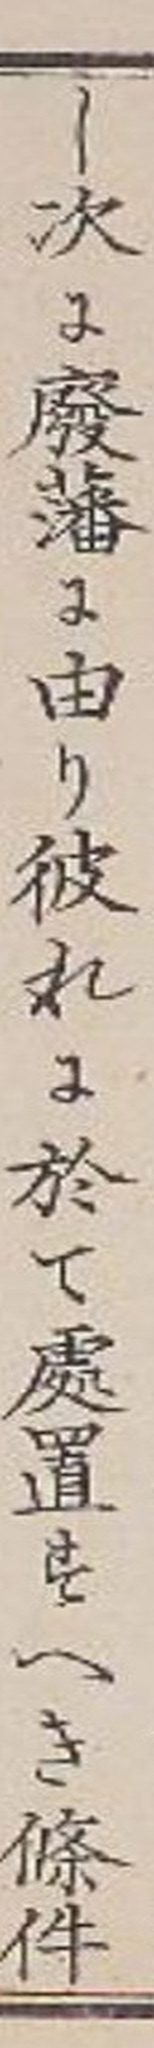し次に廃藩に由り彼れに於て処置すへき条件
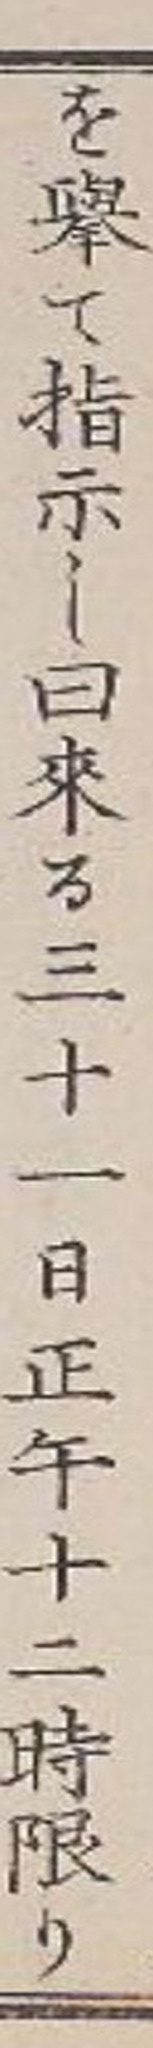を挙て指示し曰来る三十一日正午十二時限り
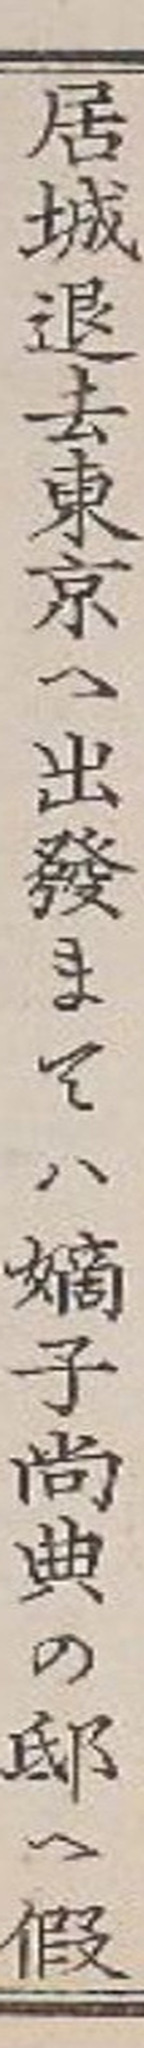居城退去東京へ出発まては嫡子尚典の邸へ仮
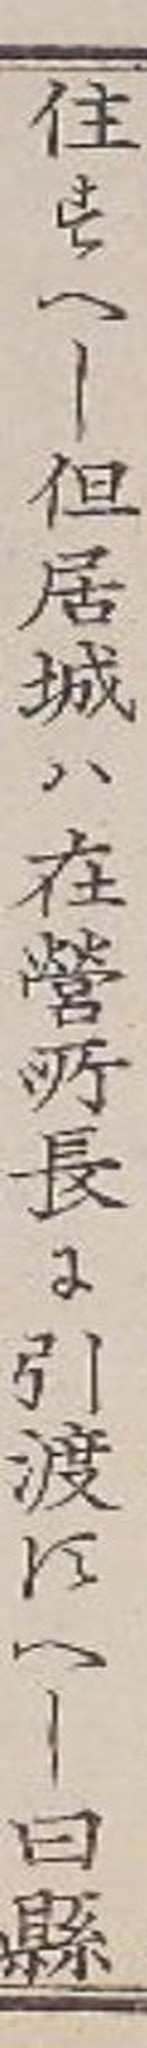住すへし但居城は在営所長に引渡すへし曰県
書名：南島紀事 下
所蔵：University of the Ryukyus Library
